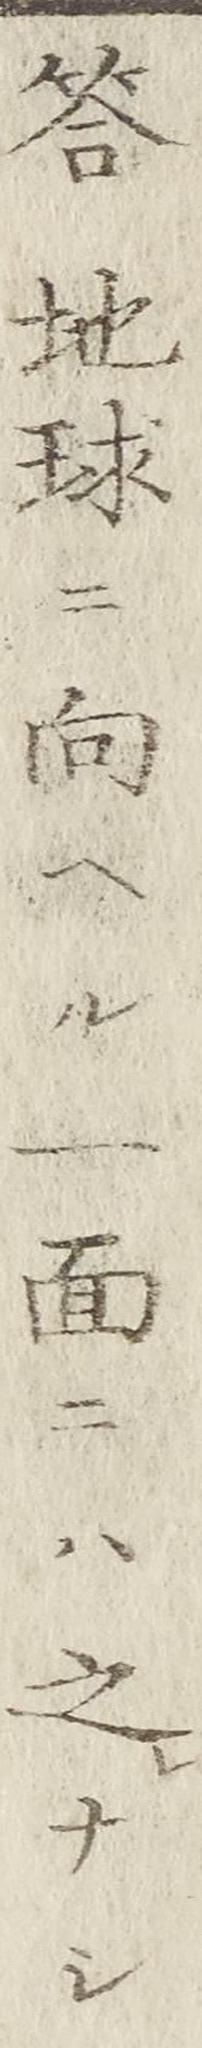答地球ニ向ヘル一面ニハ之ナシ
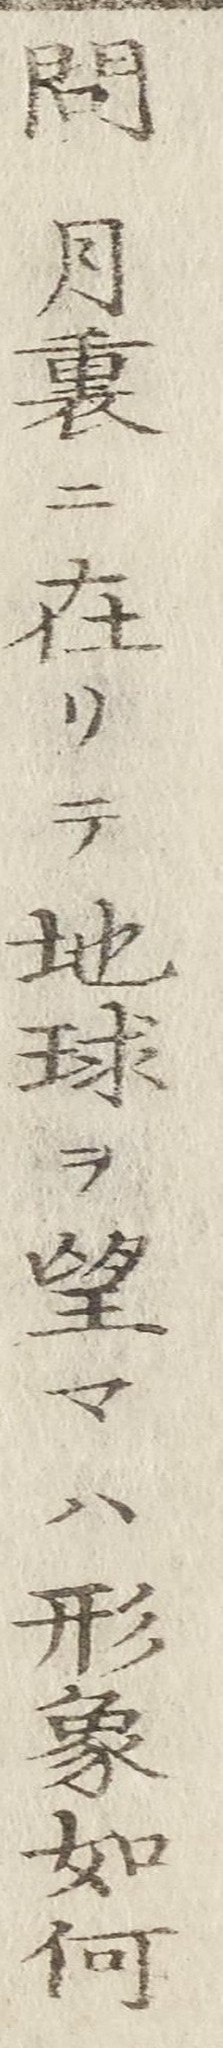問月裏ニ在リテ地球ヲ望マハ形象如何
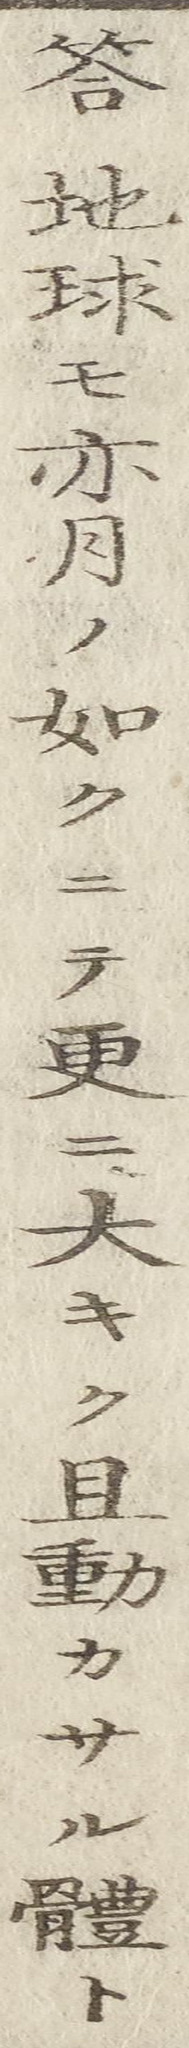答地球モ亦月ノ如クニテ更ニ大キク且動カサル体ト
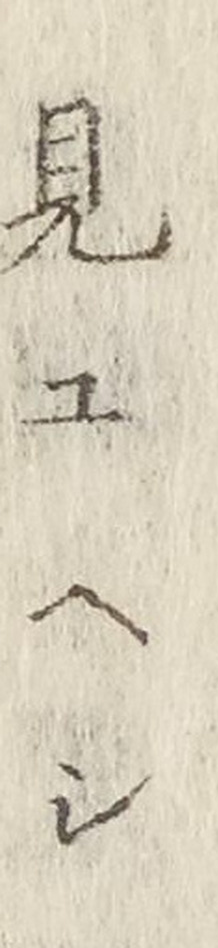見ユヘシ
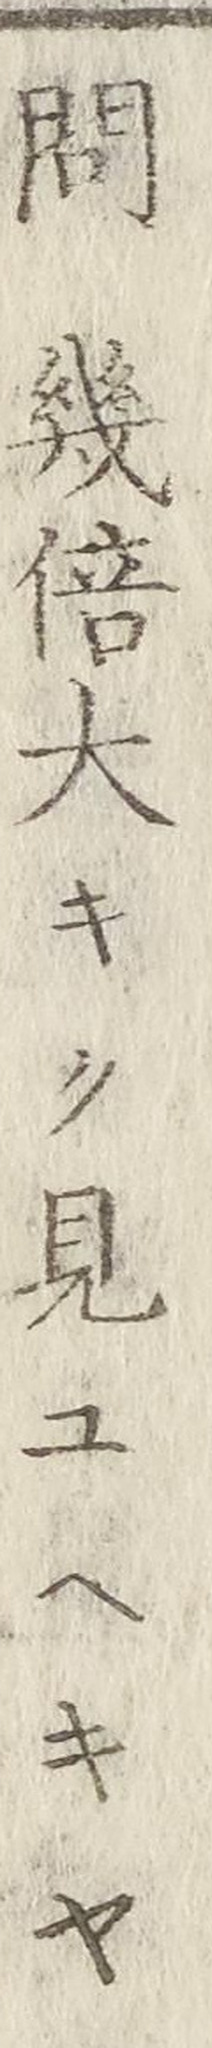問幾倍大キク見ユヘキヤ
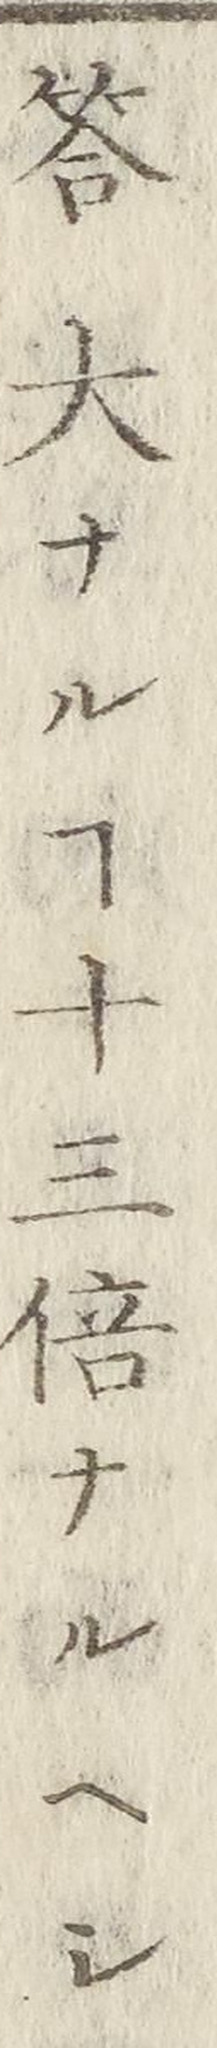答大ナルコト十三倍ナルヘシ
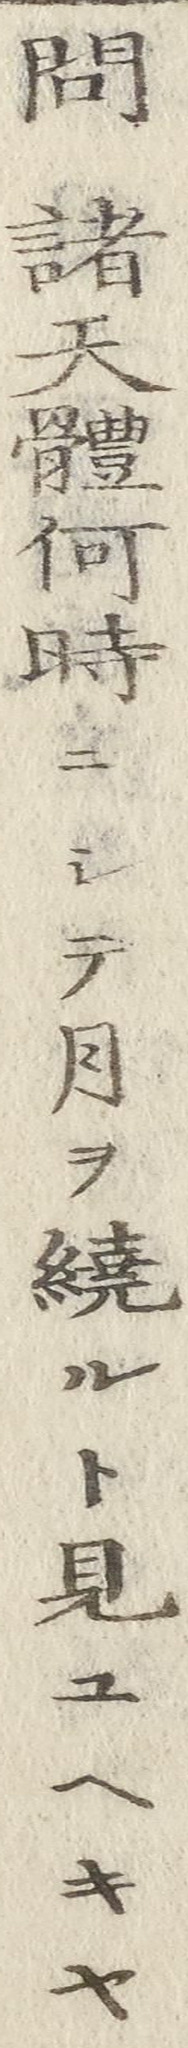問諸天体何時ニシテ月ヲ繞ルト見ユヘキヤ
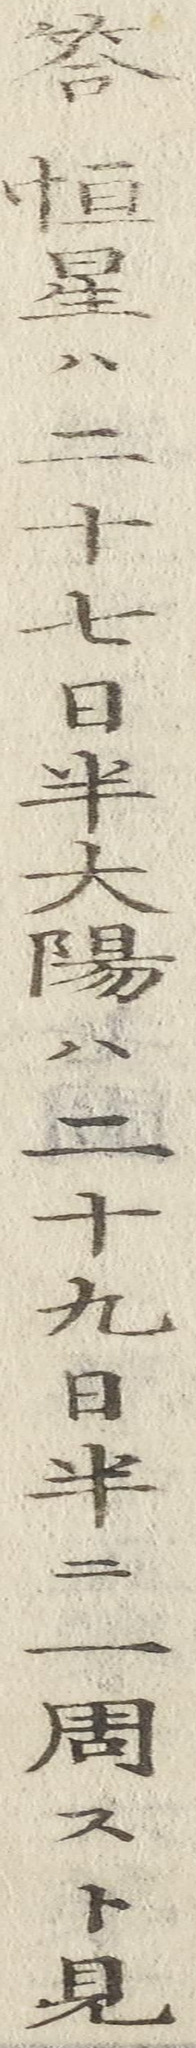答恒星ハ二十七日半大陽ハ二十九日半ニ一周スト見
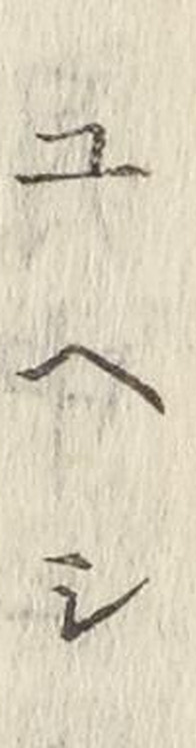ユヘシ
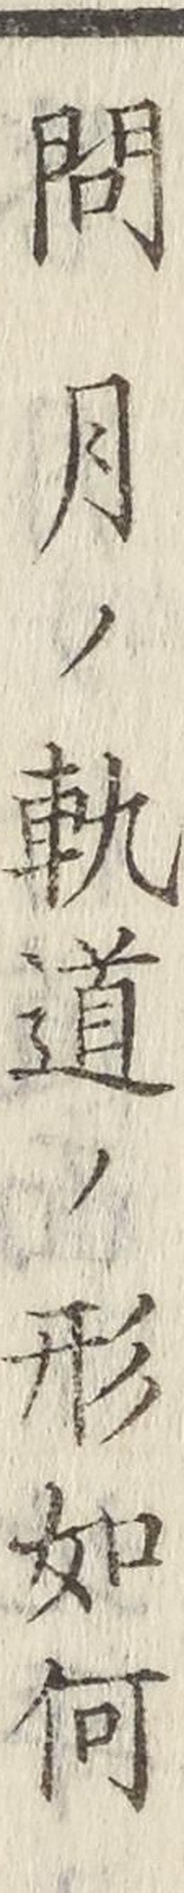問月ノ軌道ノ形如何
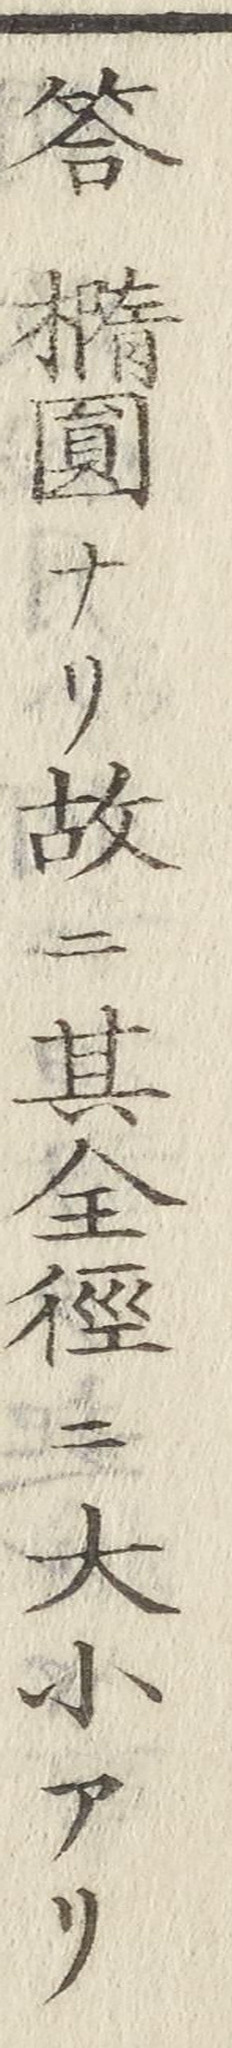答楕円ナリ故ニ其全経ニ大小アリ
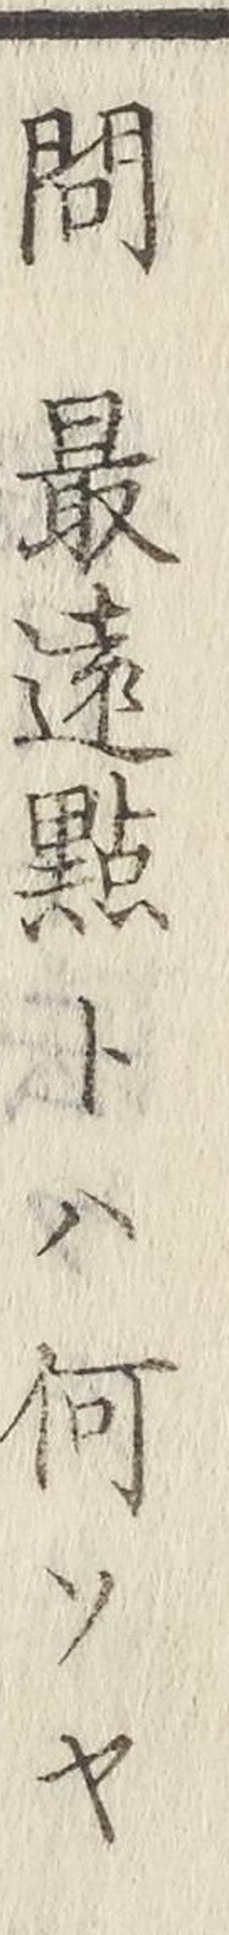問最遠点トハ何ソヤ
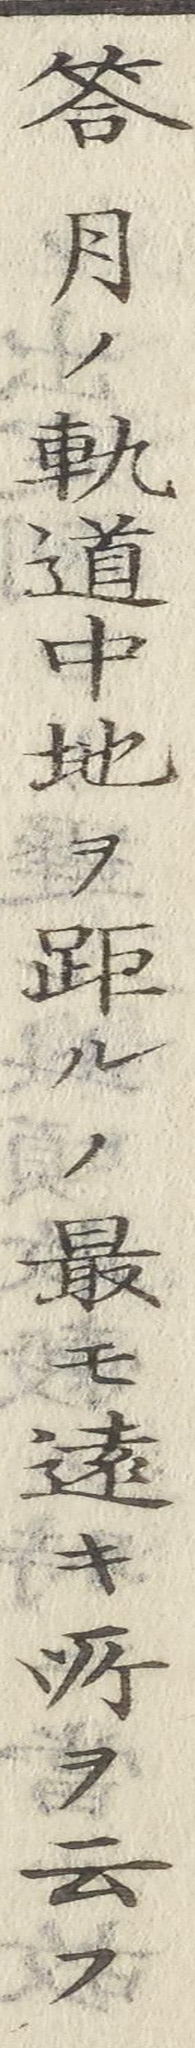答月ノ軌道中地ヲ距ルノ最モ遠キ所ヲ云フ
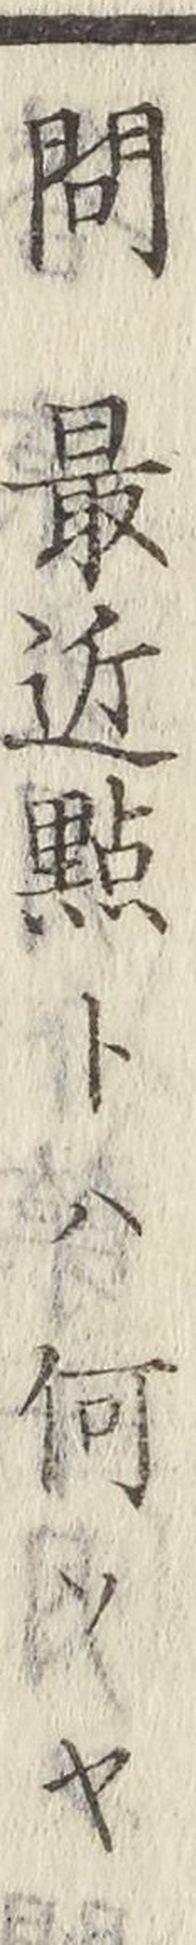問最近点トハ何ソヤ
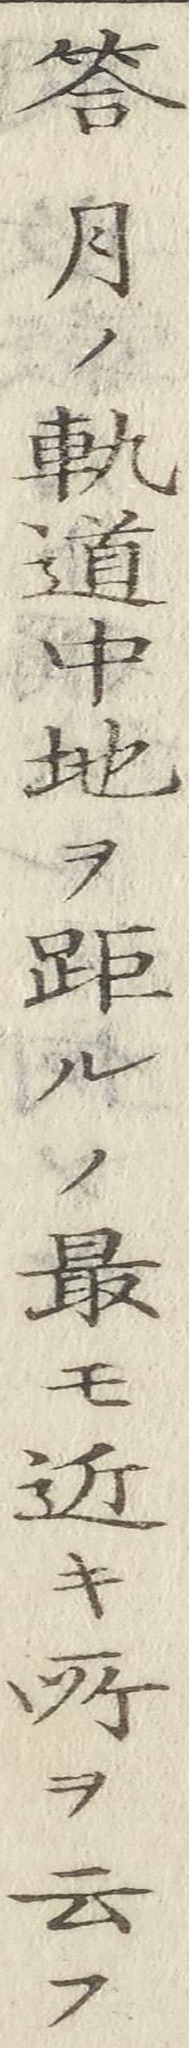答月ノ軌道中地ヲ距ルノ最モ近キ所ヲ云フ
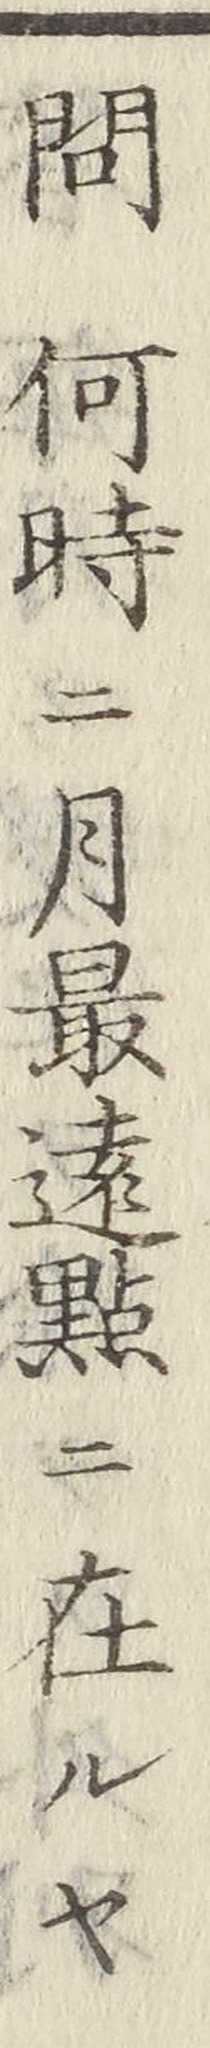問何時ニ月最遠点ニ在ルヤ
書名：星学圖説　下
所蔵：東京大学地震研究所図書室 Earthquake Research Institute Library, The University of Tokyo, JAPAN
